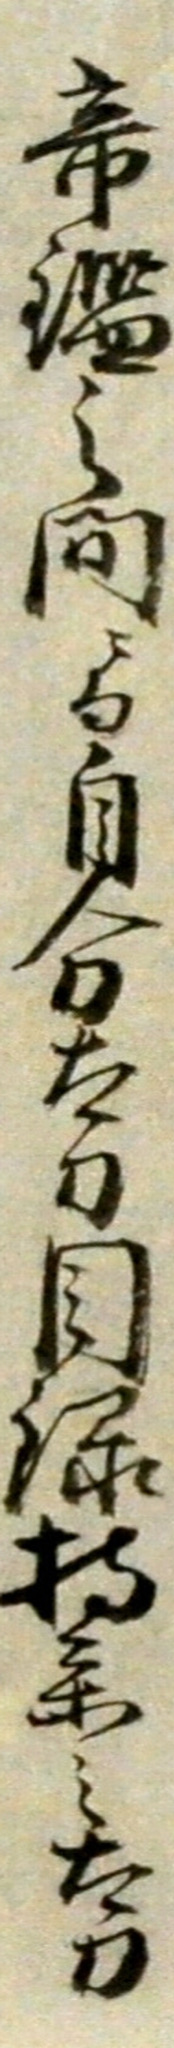定鑑之間にて自分太刀目録持参之太刀
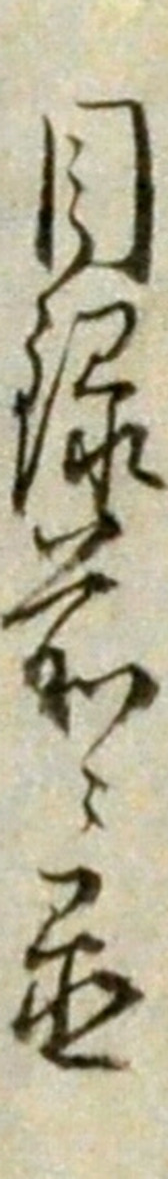目録前に置
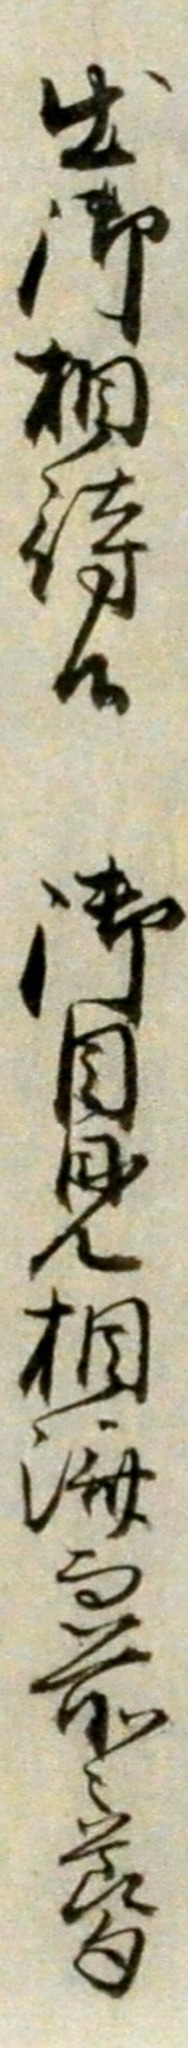出御相待候御目見相済て前々節句
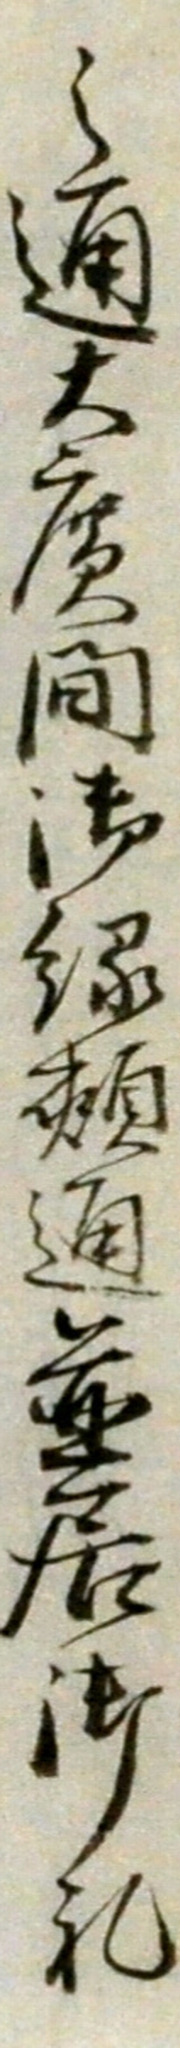之通大広間御縁頬通並居御礼
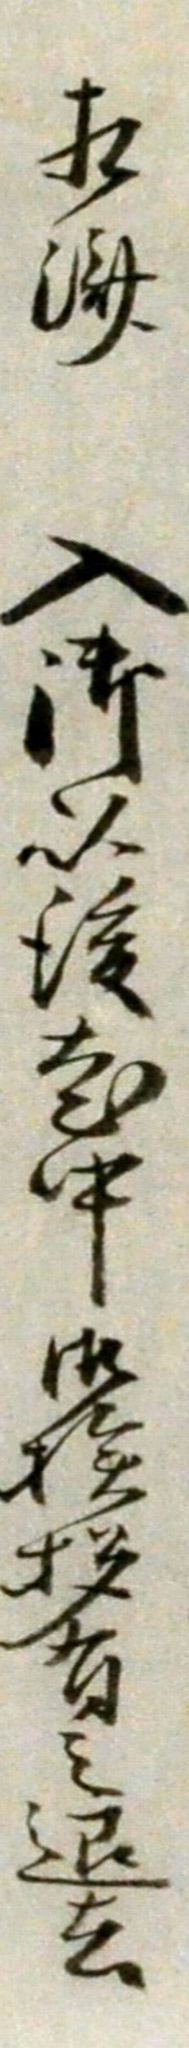相済入御以後老中御挨拶有之退去
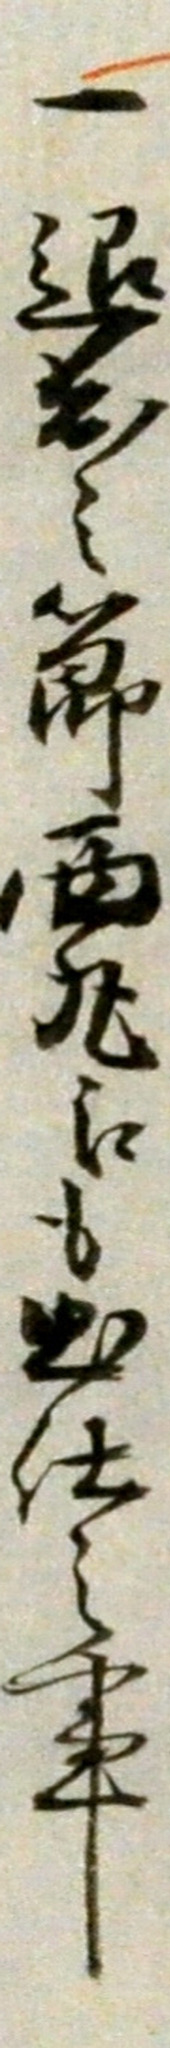一退出之節西丸えも出仕之事
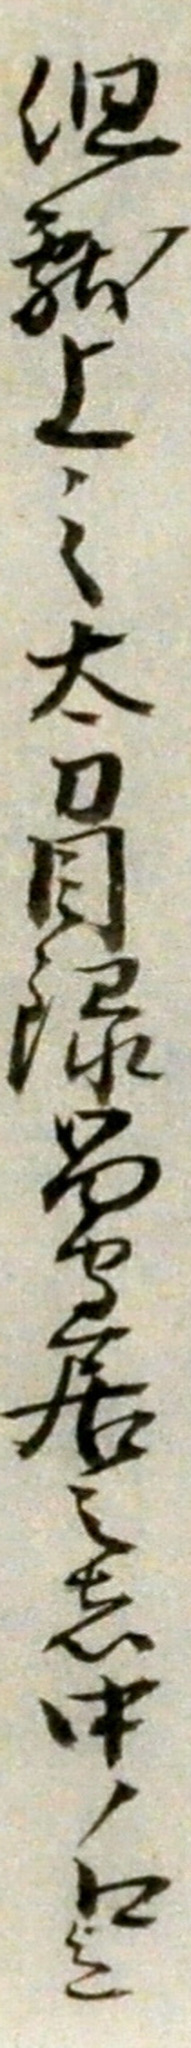但献上之太刀目録留守居之者中ノ口迄
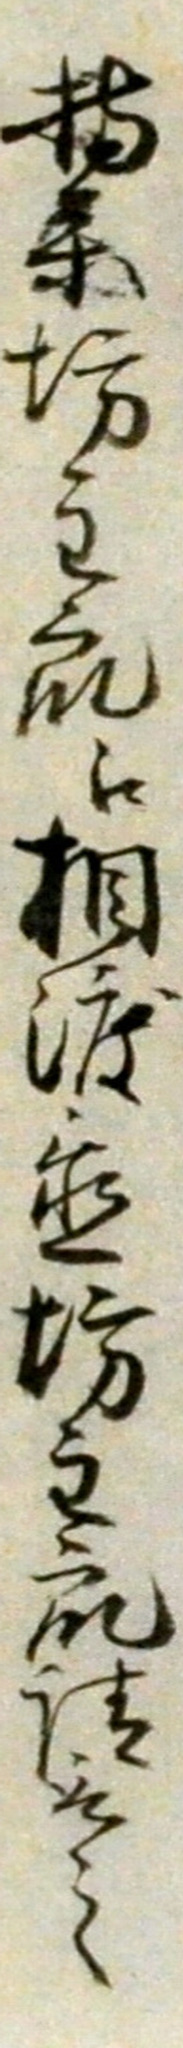持参坊主衆え相渡置坊主衆請取之
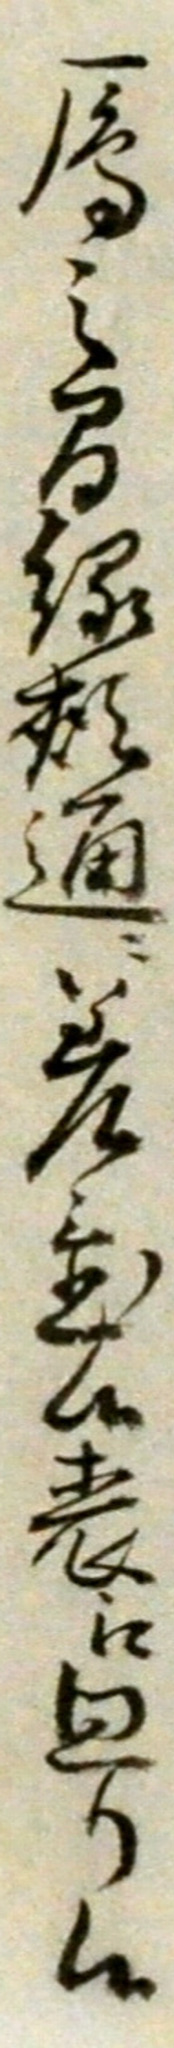雁之間縁頬通に差置候表え廻り候
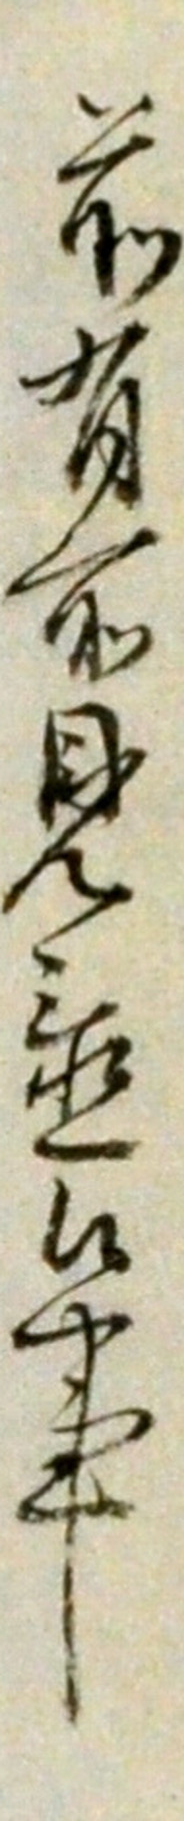前有所見置候事
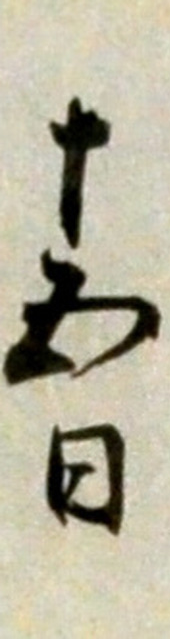十五日
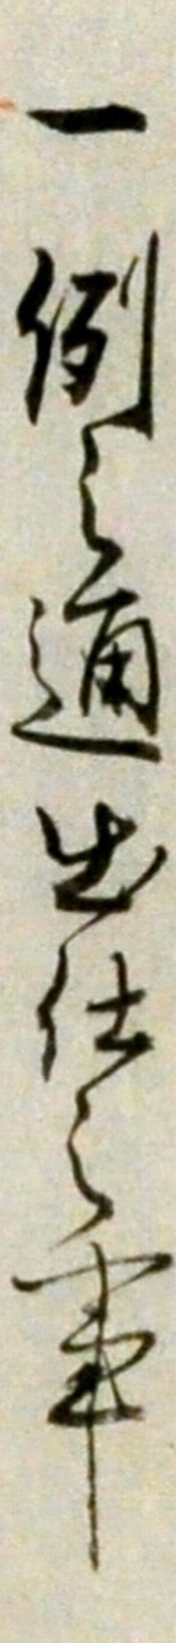一例之通出仕之事
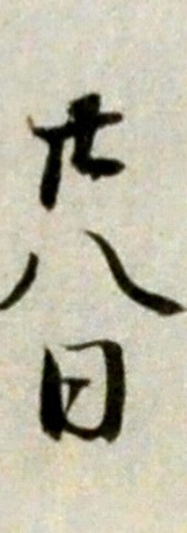廿八日
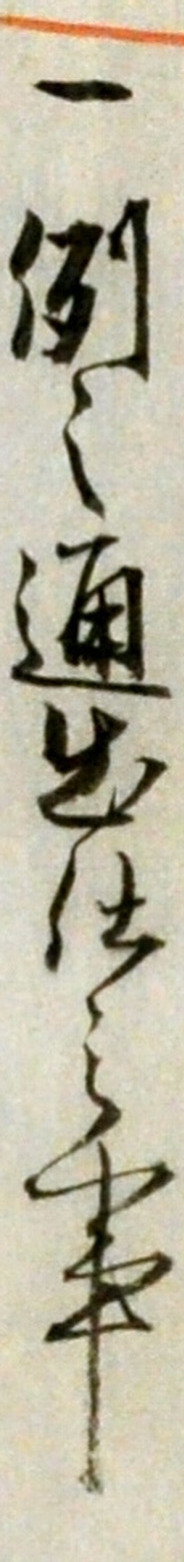一例之通出仕之事
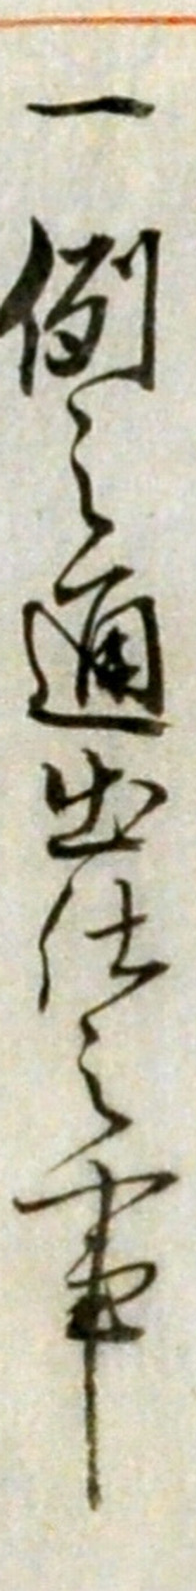一例之通出仕之事
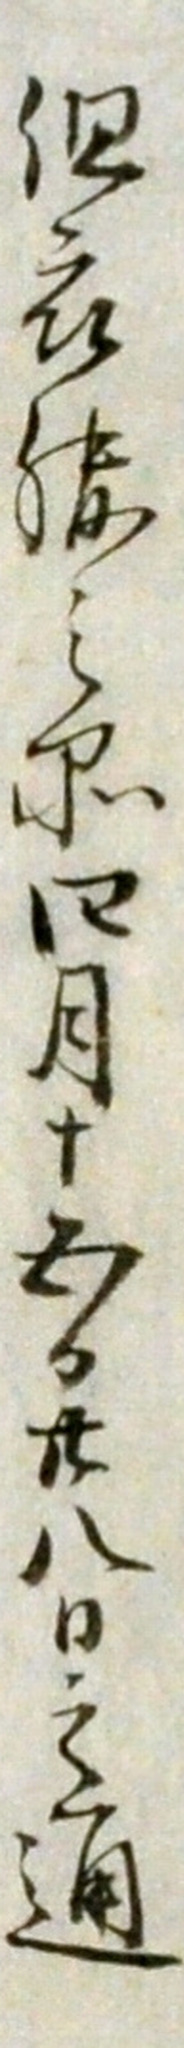但衣服之品四月十五日廿八日之通
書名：申合帳〔一括〕
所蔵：伊那市立高遠町図書館・合同会社AMANE
